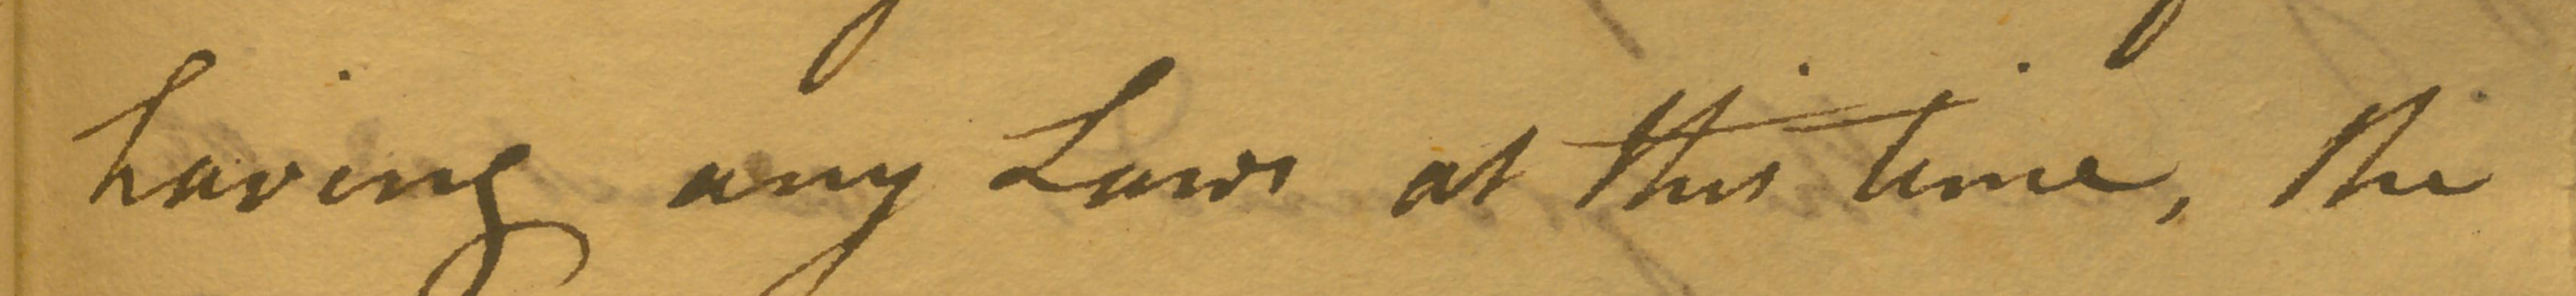having any Laws at this time, the
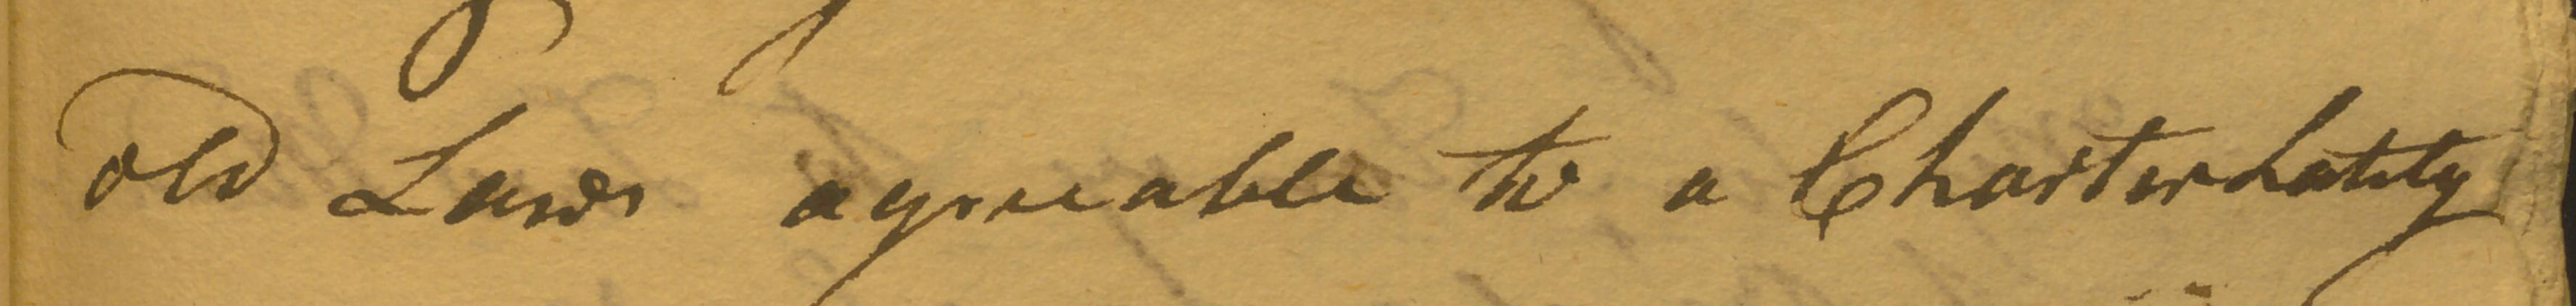old Laws agreeable to a Charter Latety
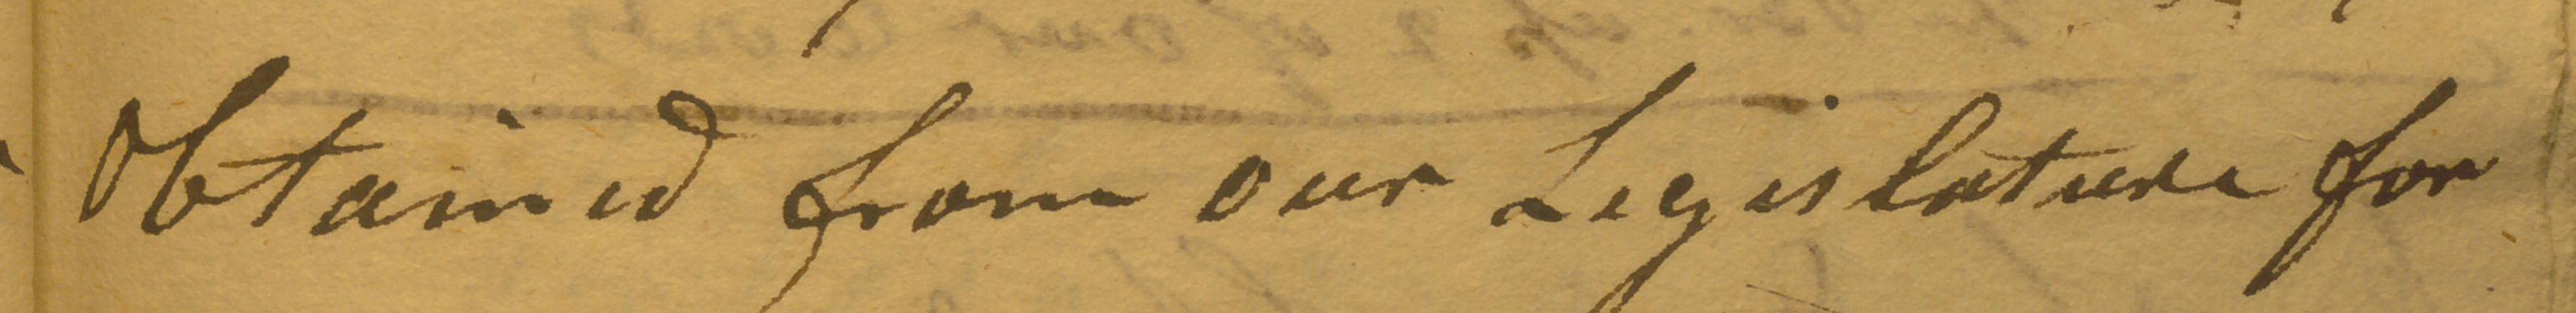obtained from our Legeslature for
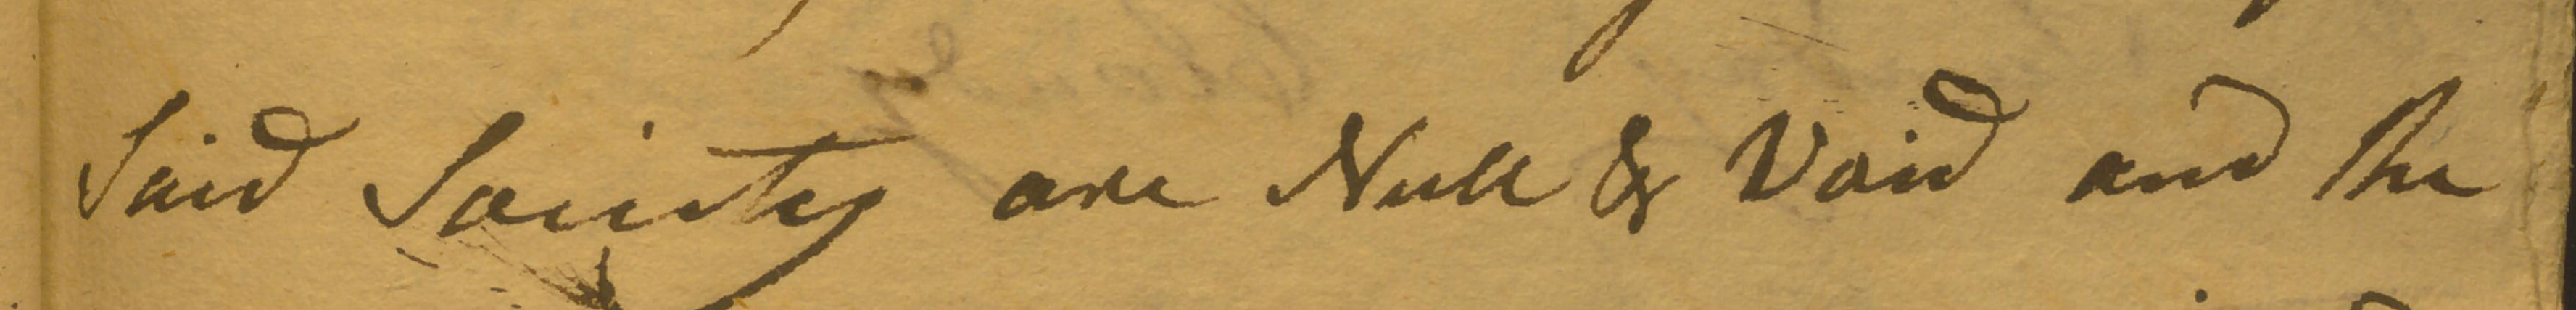said Soceity are Null & Void and the
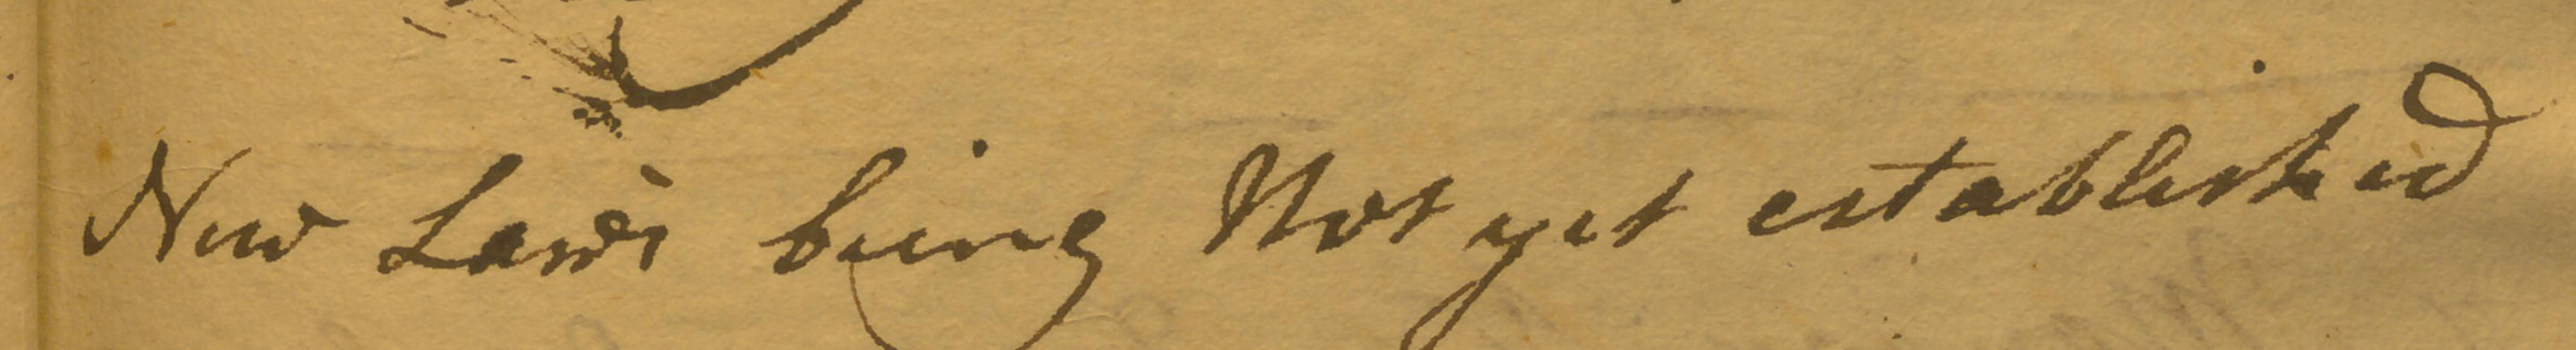New Laws being Not yet established
